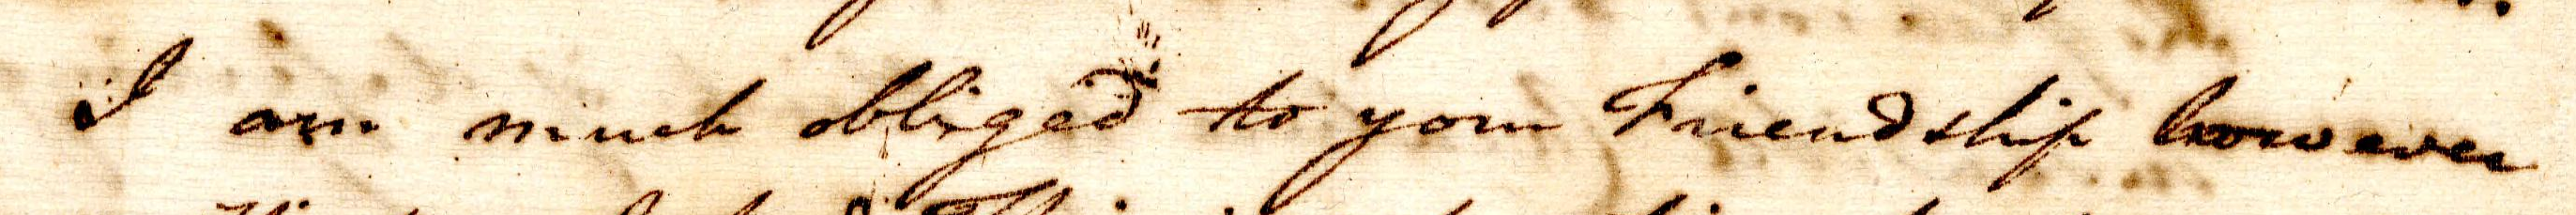I am much obliged to your Friendship however
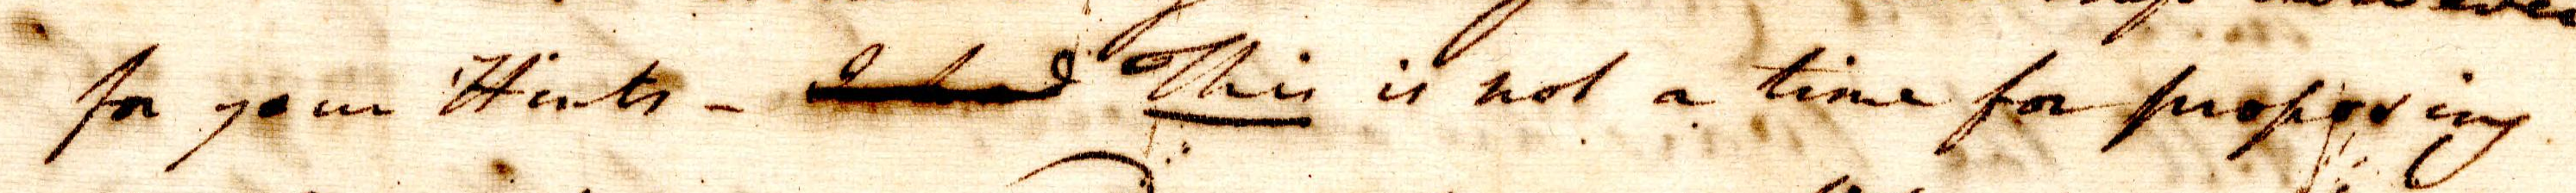for your Hints- [___] This is not a time for proposing
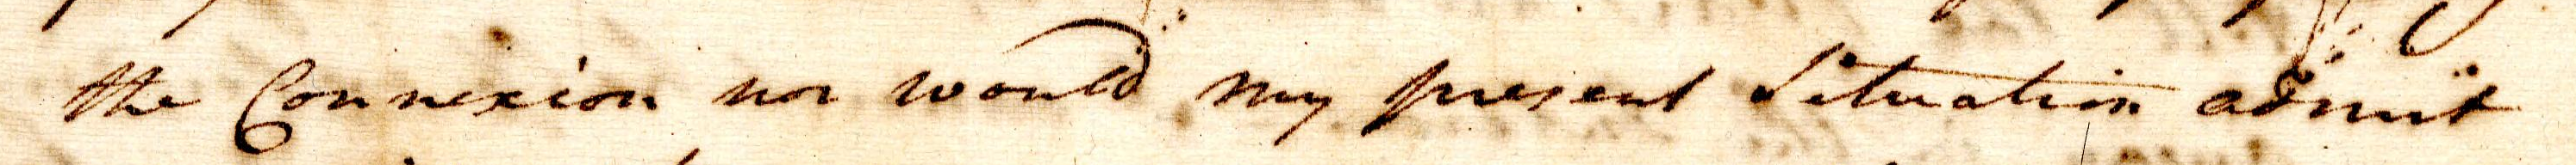the Connexion nor would my present Situation admit
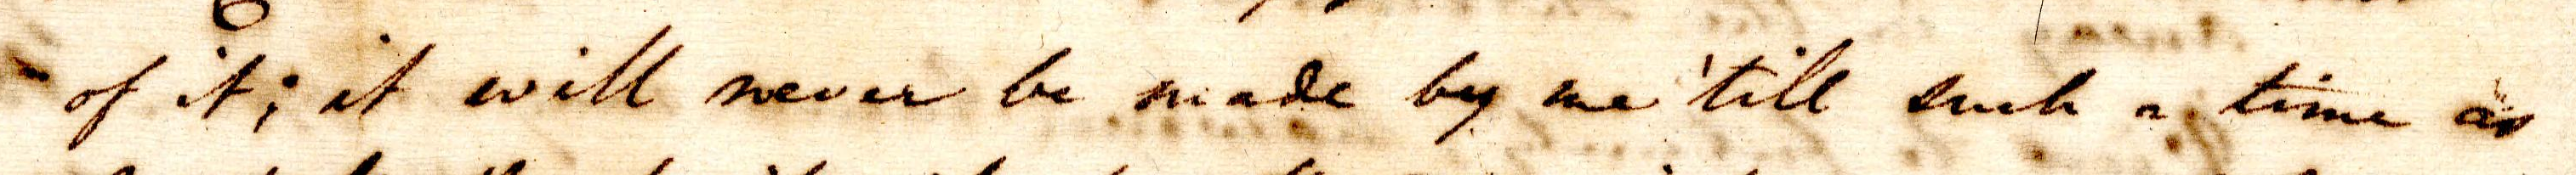of it; it will never be made by me 'till such a time as
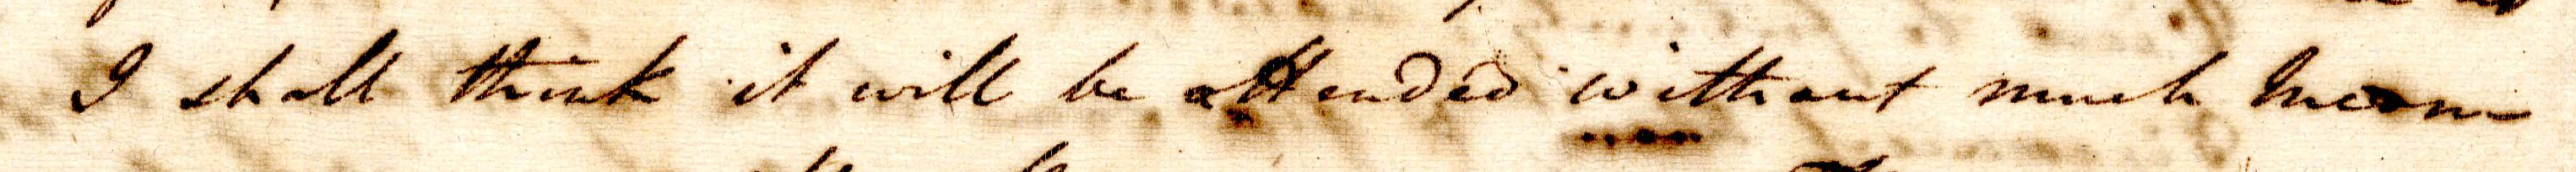I shall think it will be attended without much Incon-
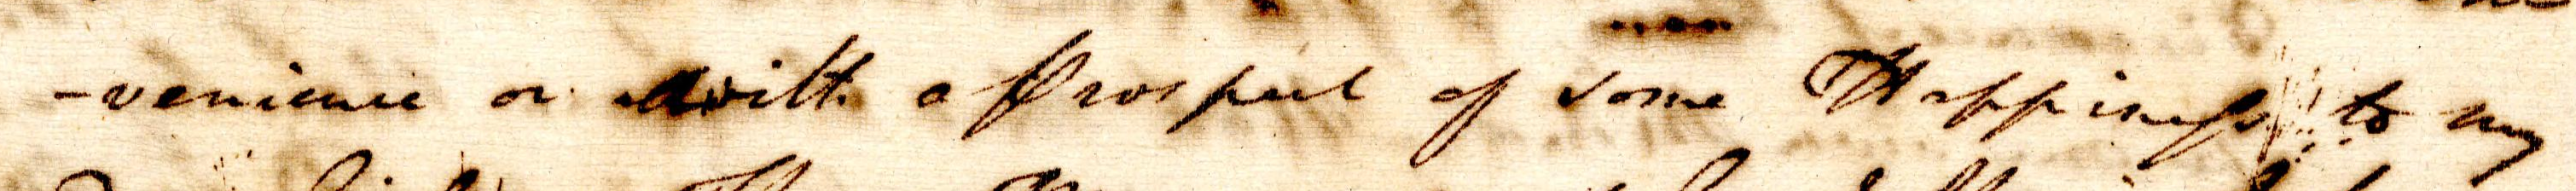-venience or [___]ilt a proposal of some Happiness to my
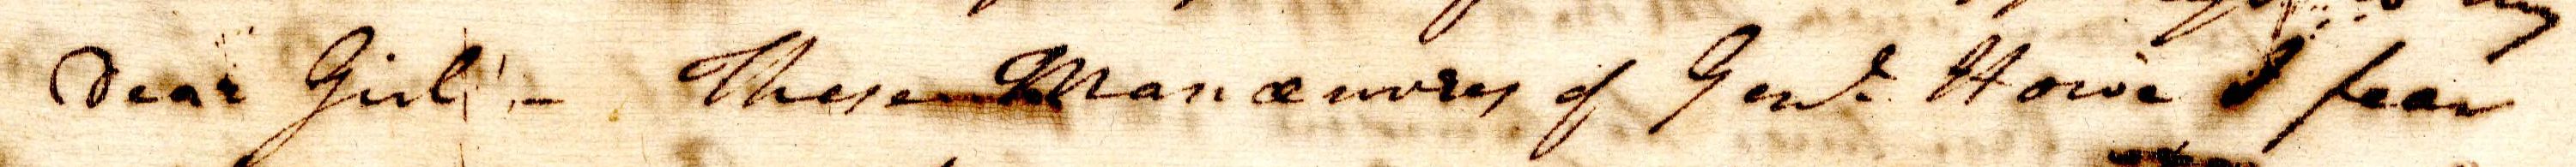dear Girl. These Maneuvers of Gen^l. Howe I fear
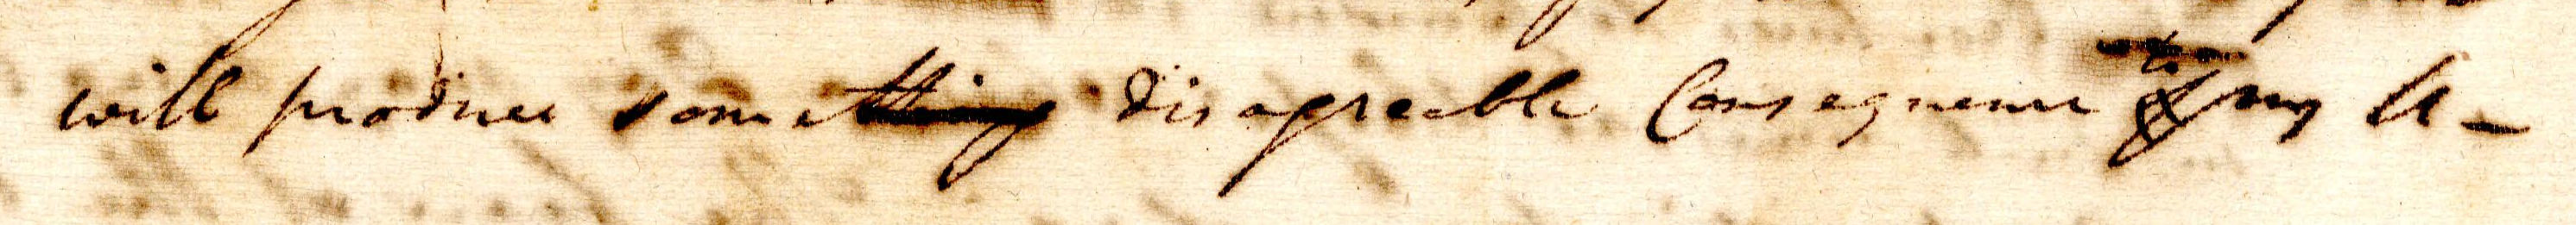will produce something disagreable Consequence & my a-
